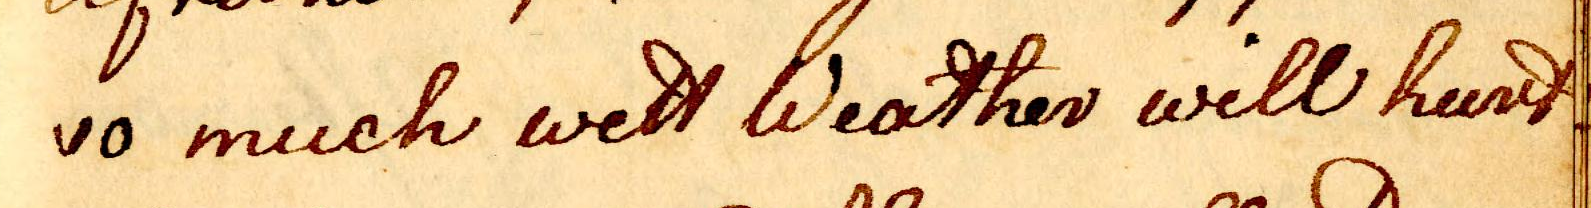so much wett Weather will hurt
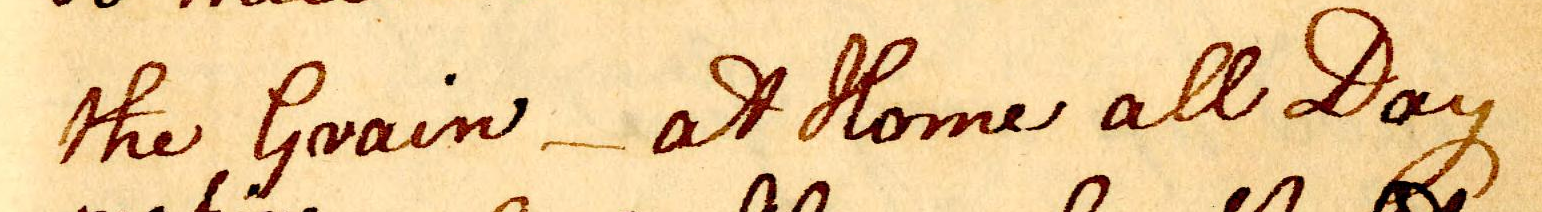the Grain- at Home all Day
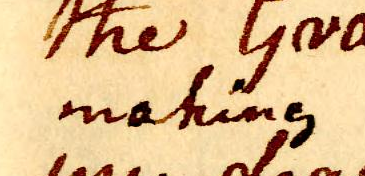making
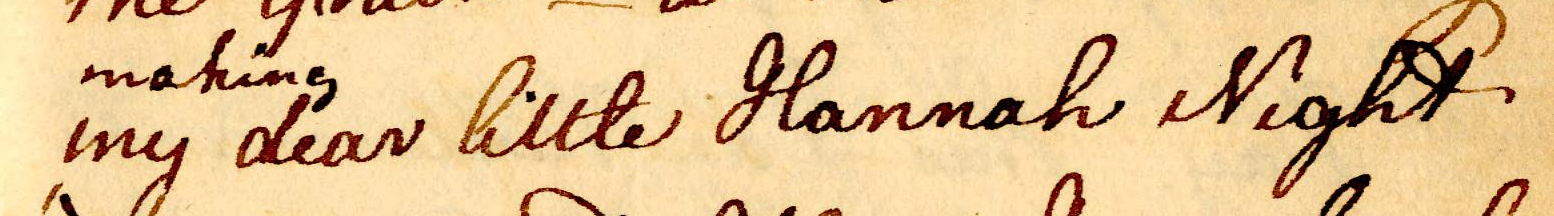^ my dear little Hannah Night
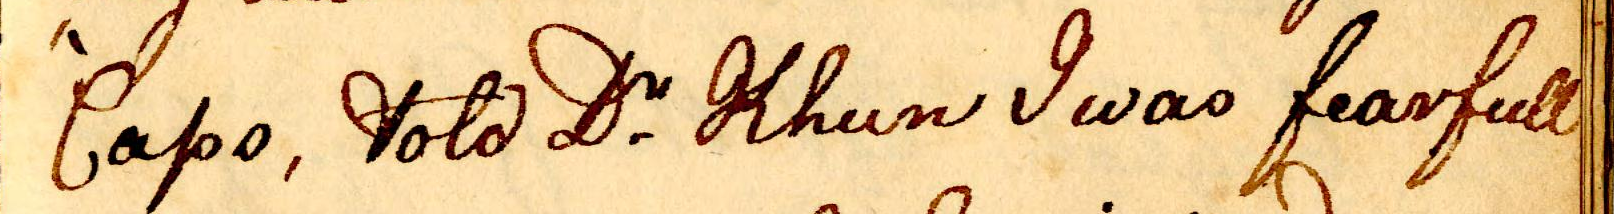Caps, told D^r. Khun I was fearfull
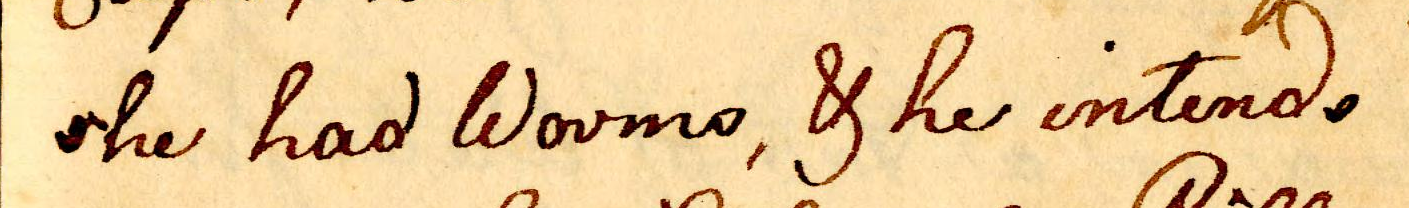she had Worms, & he intends
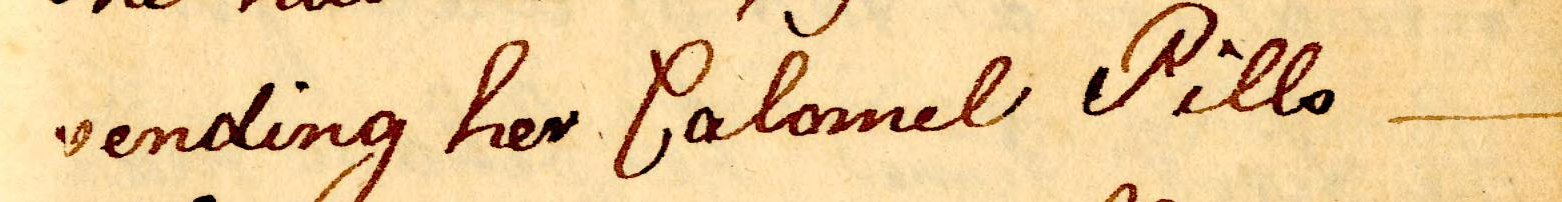sending her Calamel Pills-
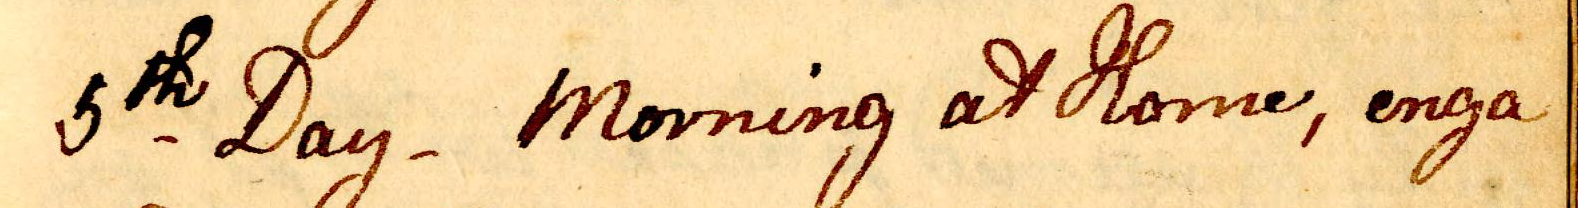5^th Day- Morning at Home, enga
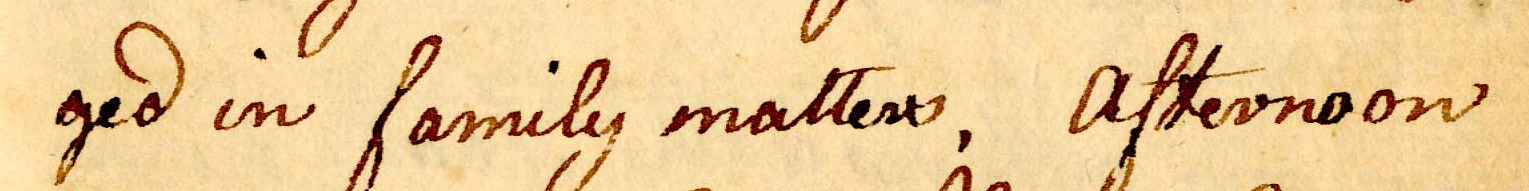ged in family matters, Afternoon
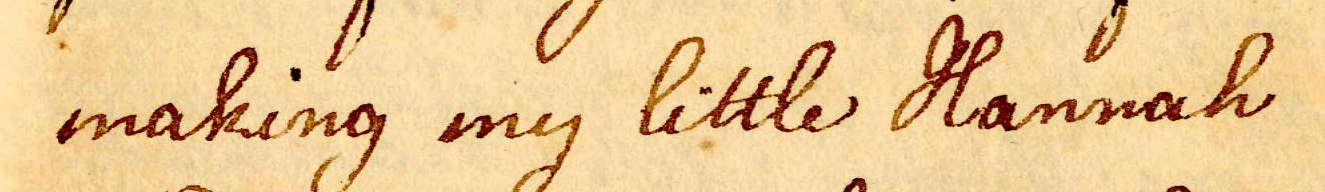making my little Hannah
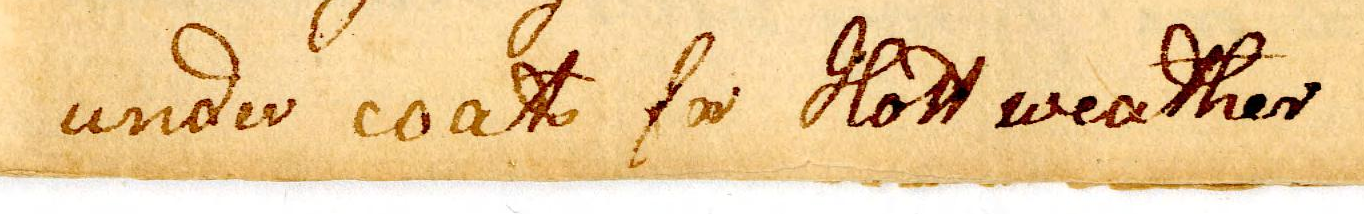under coats for Hott weather
